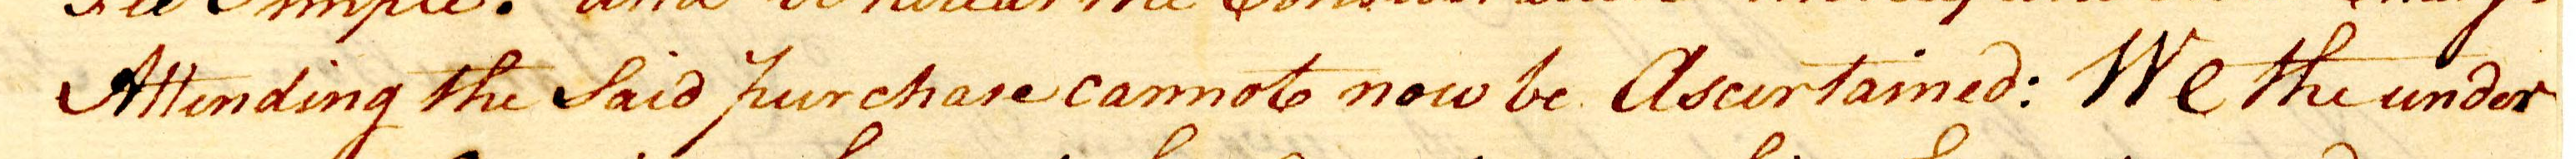Attending the said purchase cannot now be Ascertained: We the under
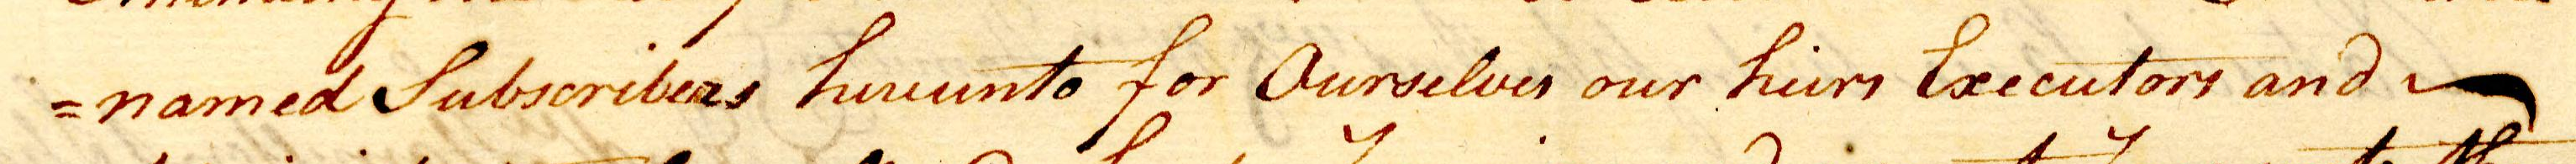-named Subscribers hereunto for Ourselves our heirs Executors and-
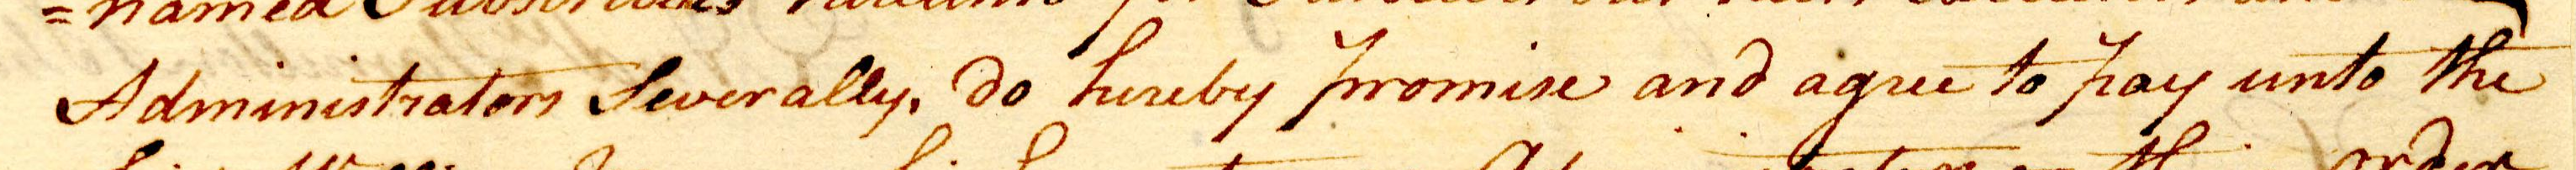Administrators Severally, do hereby promise and agree to pay unto the
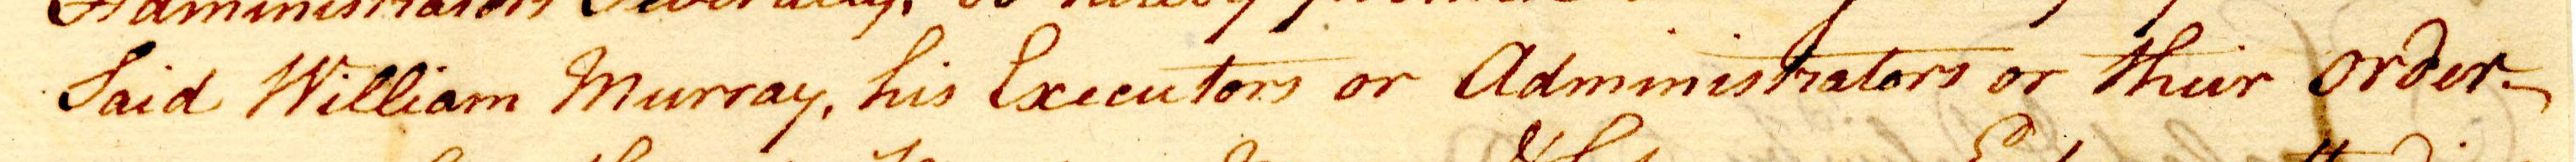Said William Murray, his Executors or Administrators or their order-
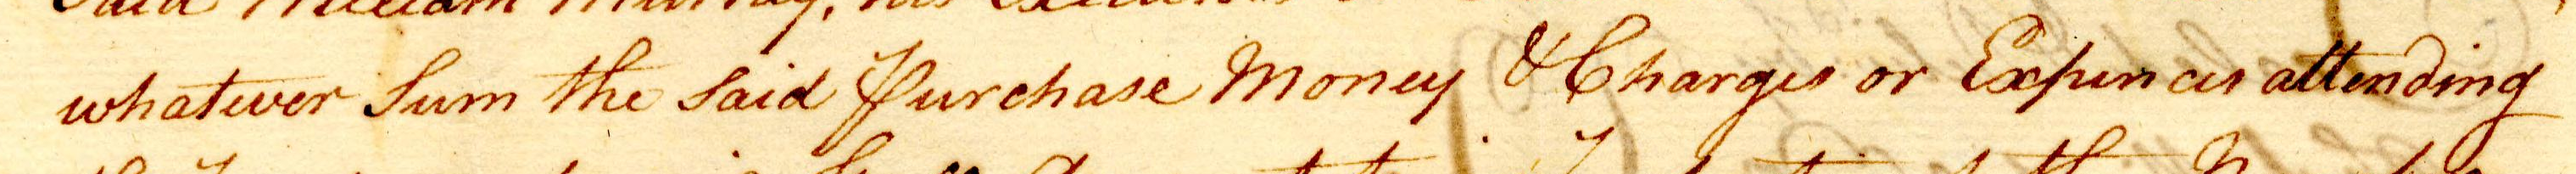whatever Sum the said purchase Money & Charges or Expenses attending
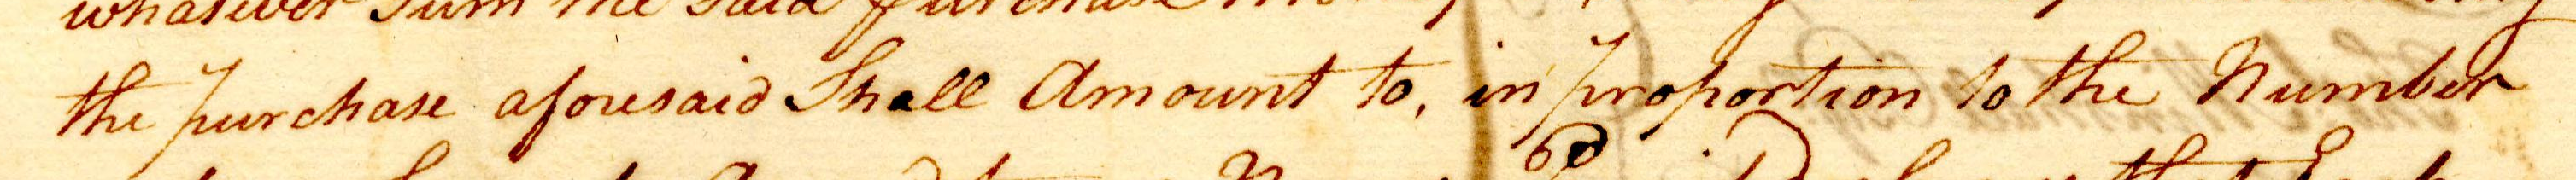the purchase aforesaid Shall Amount to, in proportion to the Number
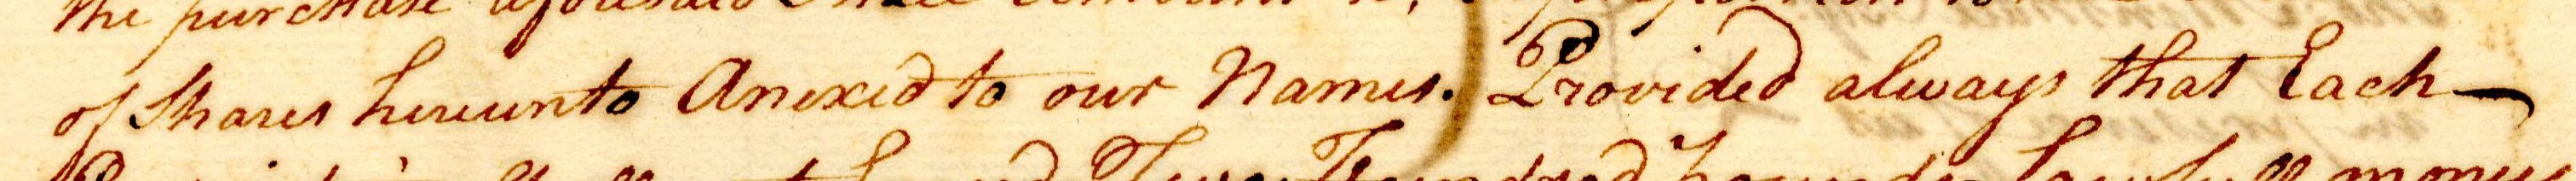of shares hereunto Anexed to our Names. Provided always that Each-
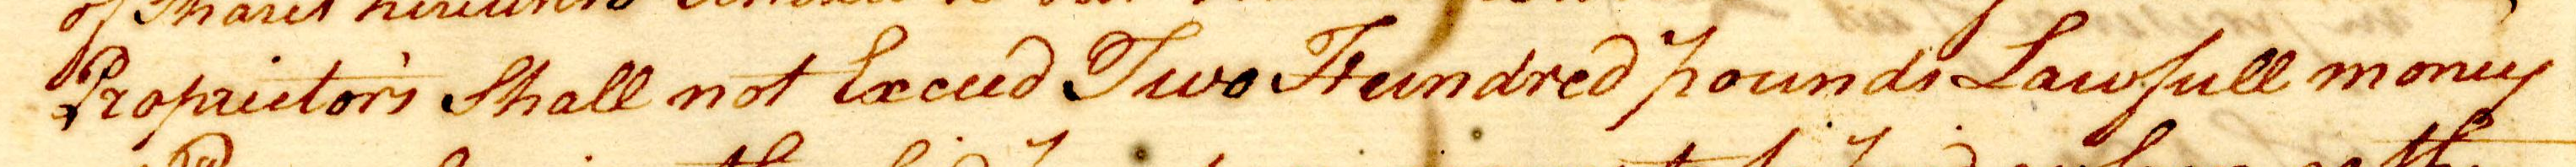Proprietor shall not Exceed Two Hundred pounds Lawfull money
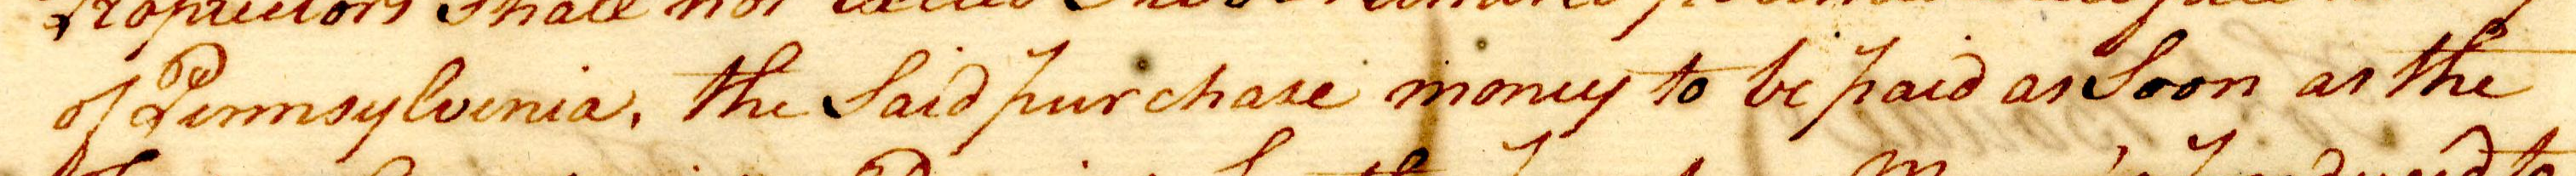of Pennsylvania. the Said purchase money to be paid as Soon as the
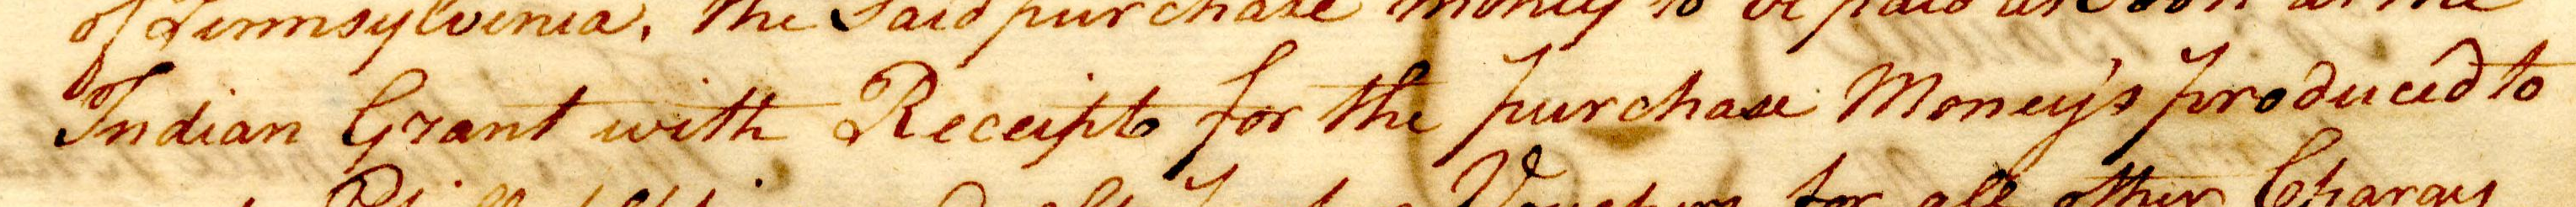Indian Grant with Receipts for the purchase Money's produced to
